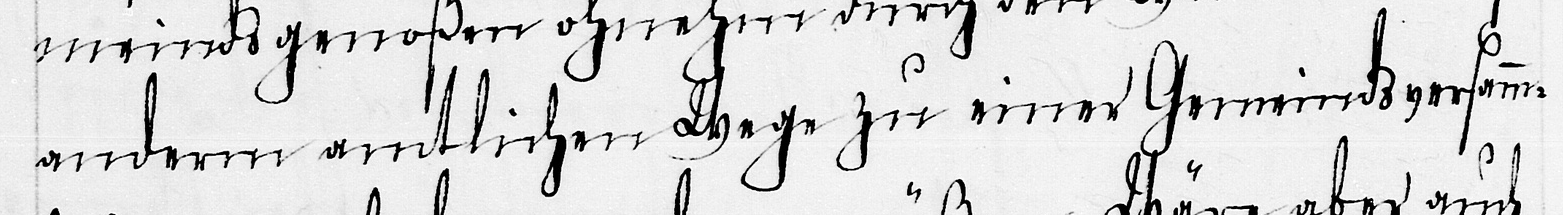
anderm amtlichen Wege zu einer Gemeindsversam¬
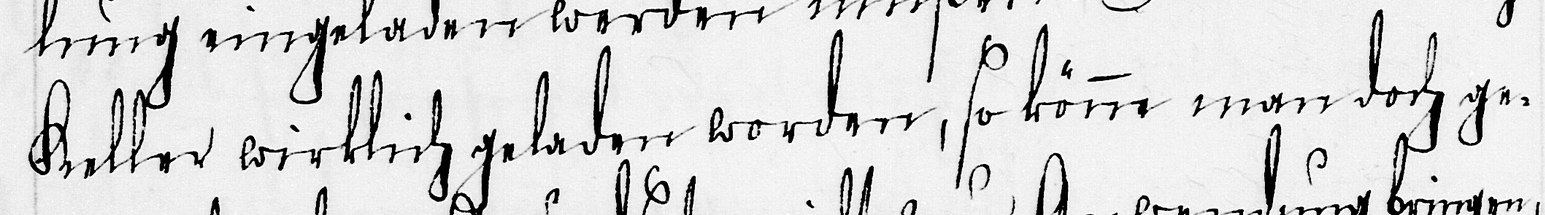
Keller wirklich geladen worden, so könne man doch ge¬
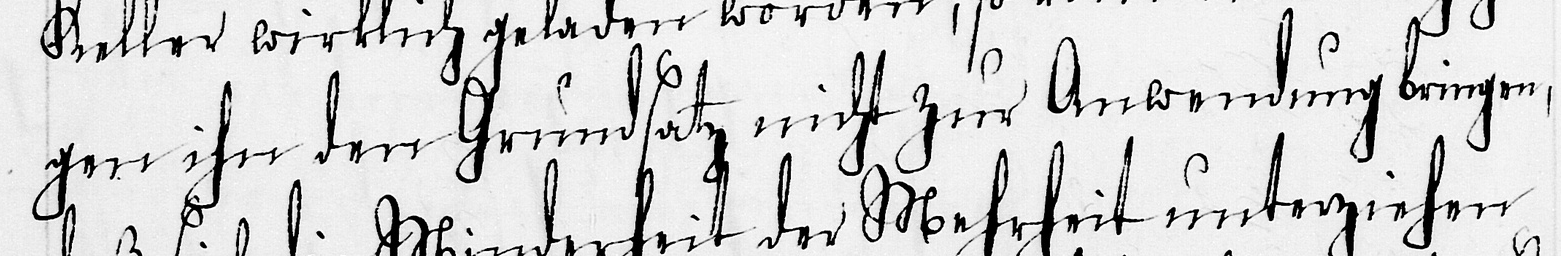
gen ihn den Grundsatz nicht zur Anwendung bringen,
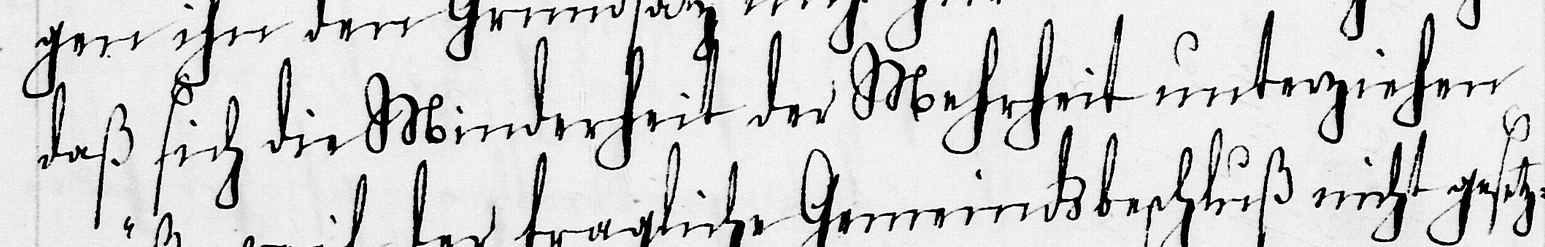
daß sich die Minderheit der Mehrheit unterziehen
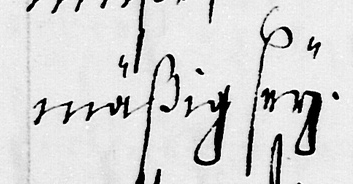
mäßig sey.
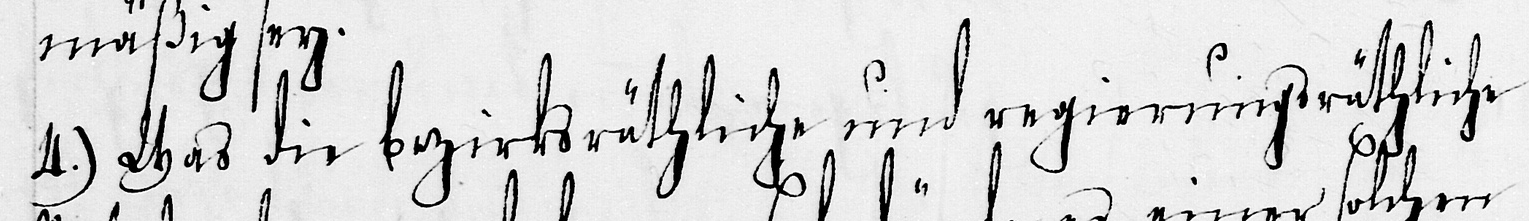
4.) Was die bezirksräthliche und regierungsräthliche
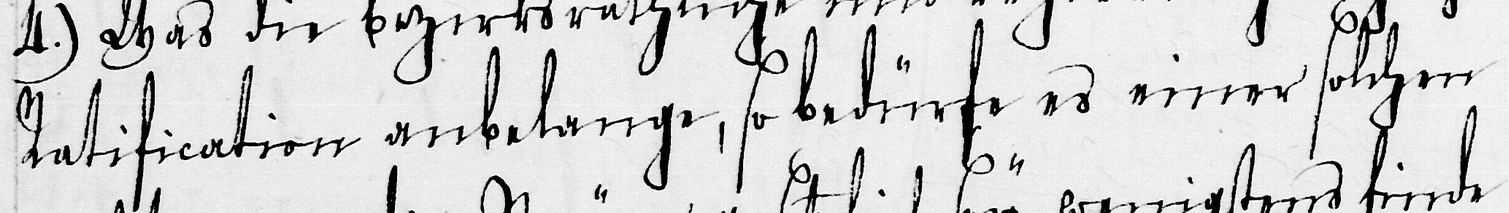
Ratification angelange, so bedürfe es einer solchen
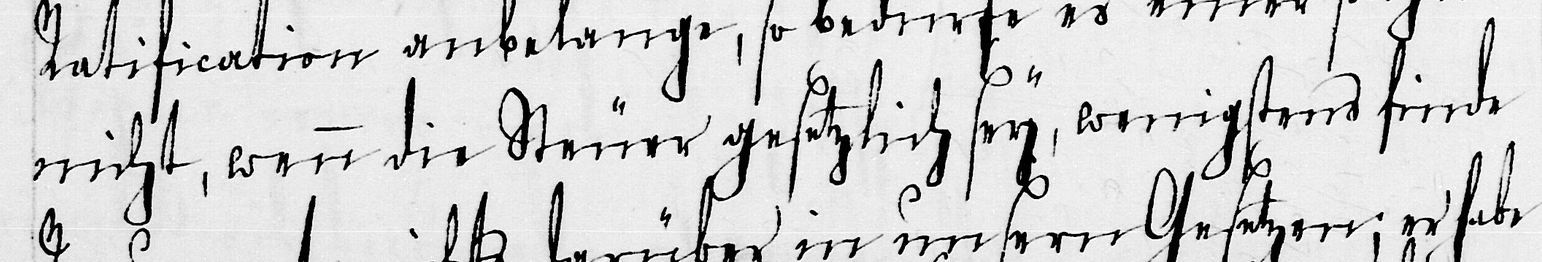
nicht, wenn die Steuer gesetzlich sey, wenigstens finde
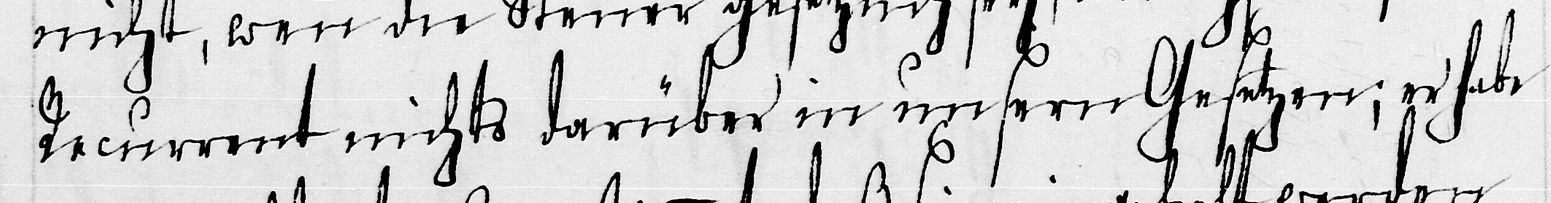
Recurrent nichts darüber in unsern Gesetzen; er habe
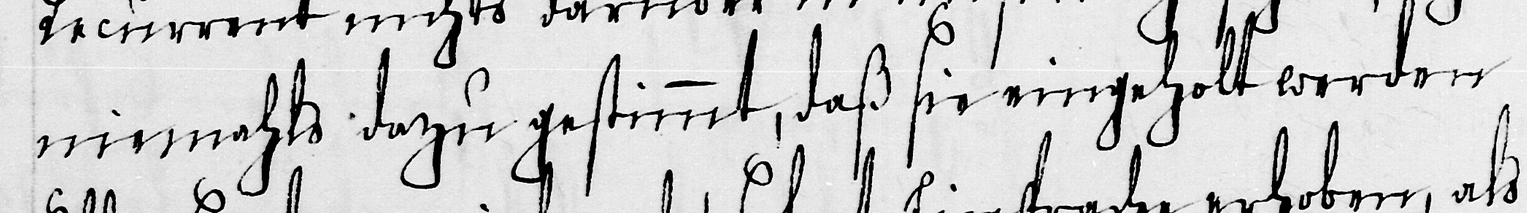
niemahls dazu gestimmt, daß sie eingeholt werden
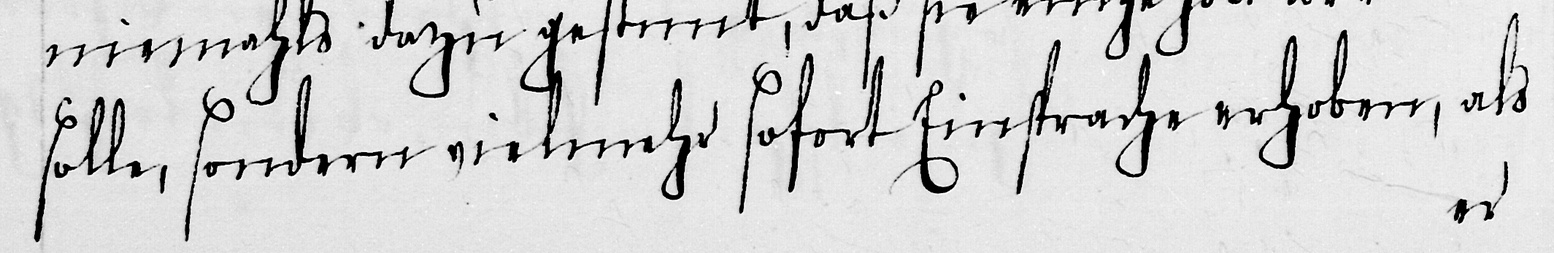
solle, sondern vielmehr sofort Einsprache erhoben, als
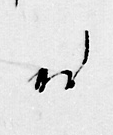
der
